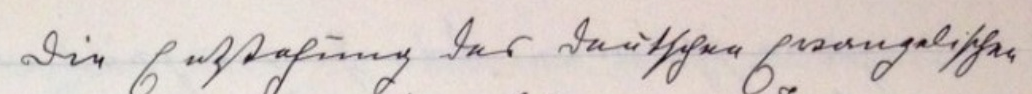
Die Entstehung des Deutschen Evangelischen
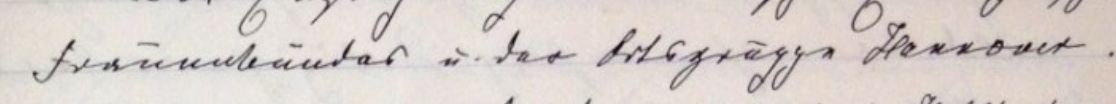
Frauenbundes u. der Ortsgruppe Hannover
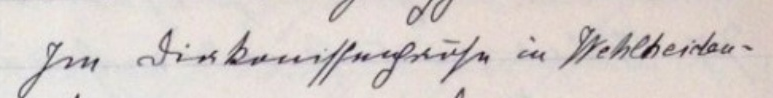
Im Diakonissenhause in Wehlheiden-
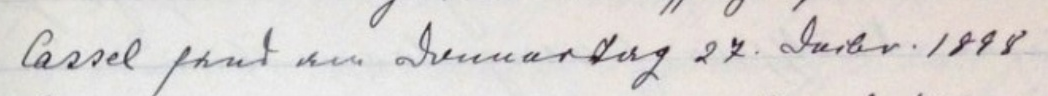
Cassel fand am Donnerstag 27. Debr. 1898
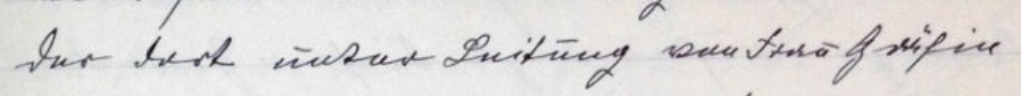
der dort unter der Leitung von Frau Gräfin
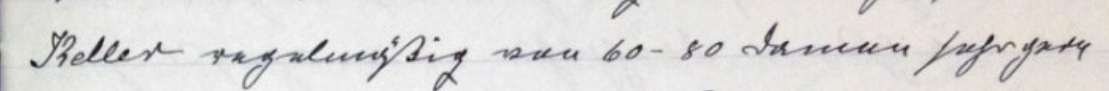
regelmäßig von 60-80 Damen sehr gern
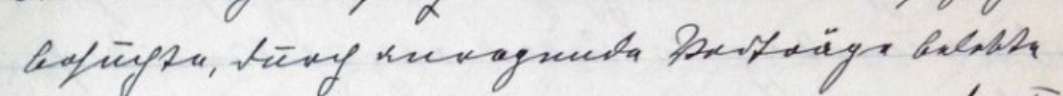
besuchte durch anregende Vorträge belebte
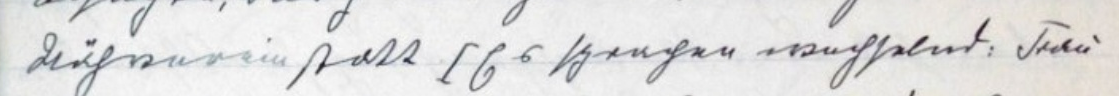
[Es sprachen wechselnd: Frau
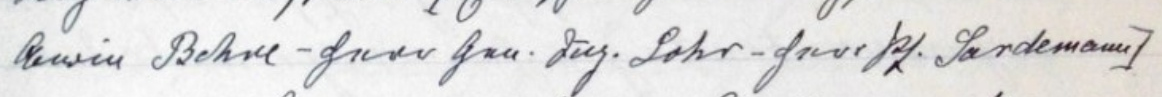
Oberin Behre, Herr Gen. Sup.Lohr - Herr Pf. Sardemann]
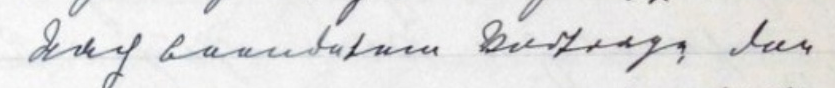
Nach beendetem Vortrage der
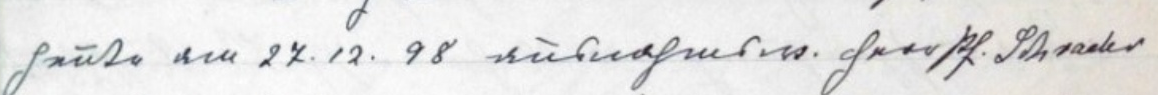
heute am 27.12.98 ausnahmsw. Herr Pfr. Schrader
